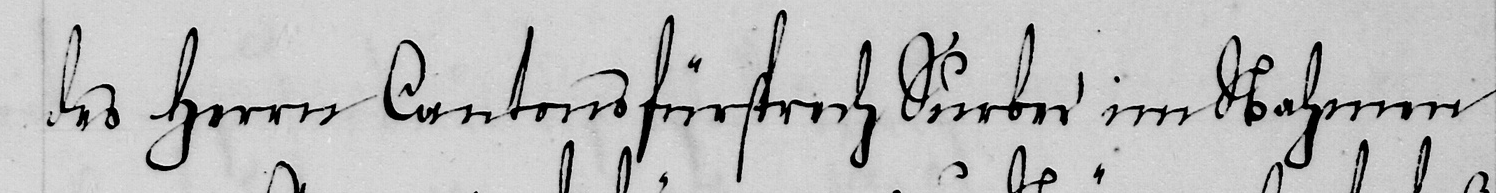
des Herrn Cantonsfürsprech Surber im Nahmen
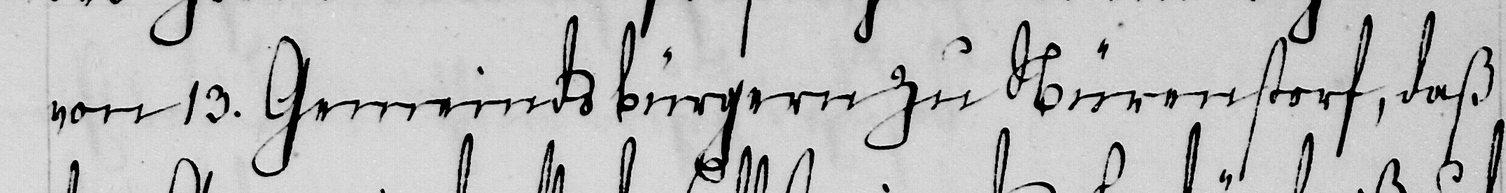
von 13. Gemeindsbürgern zu Nürenstorf, daß
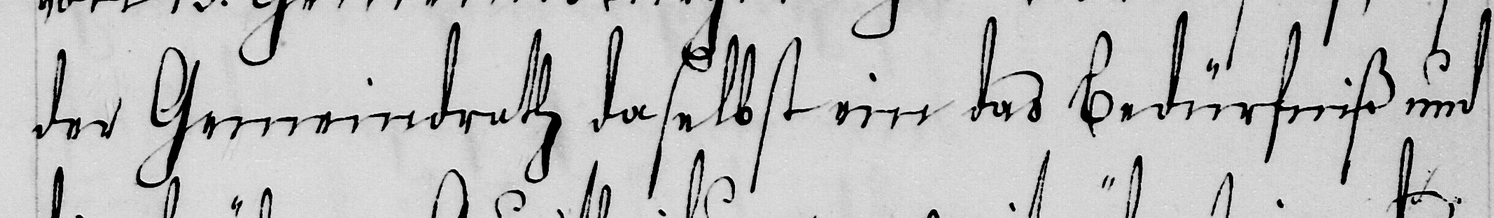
der Gemeindrath daselbst ein das Bedürfniß und
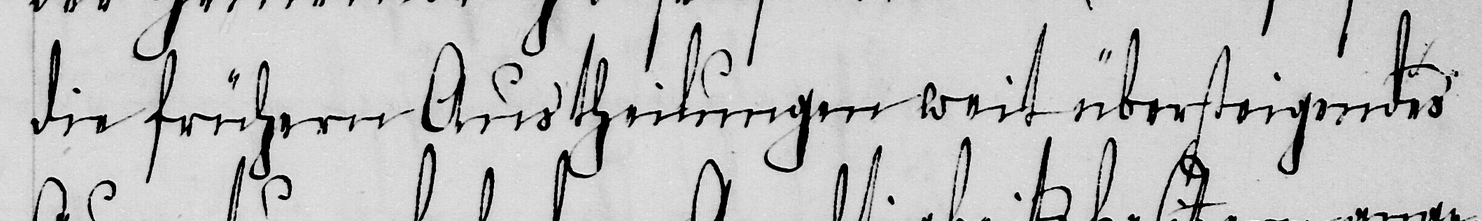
die frühern Austheilungen weit übersteigendes
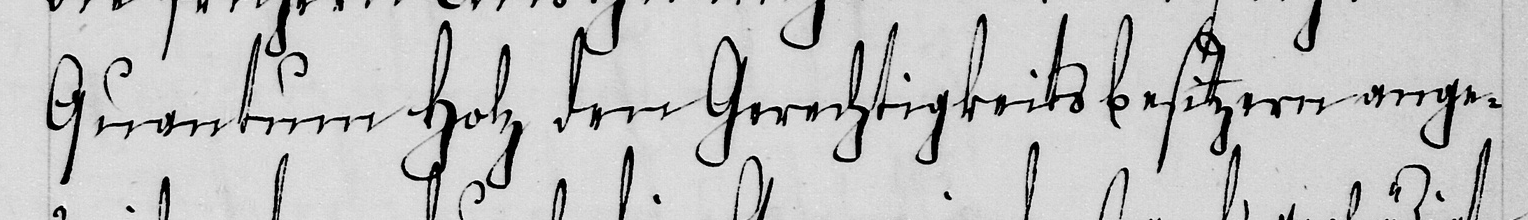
Quantum Holz den Gerechtigkeitsbesitzern ange¬
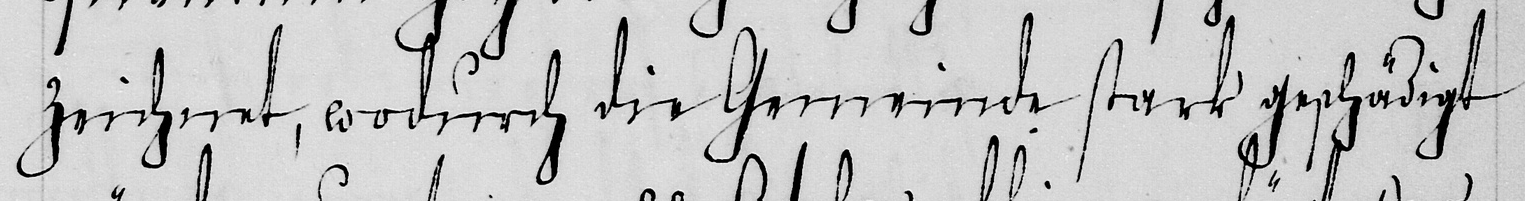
zeichnet, wodurch die Gemeinde stark geschädigt
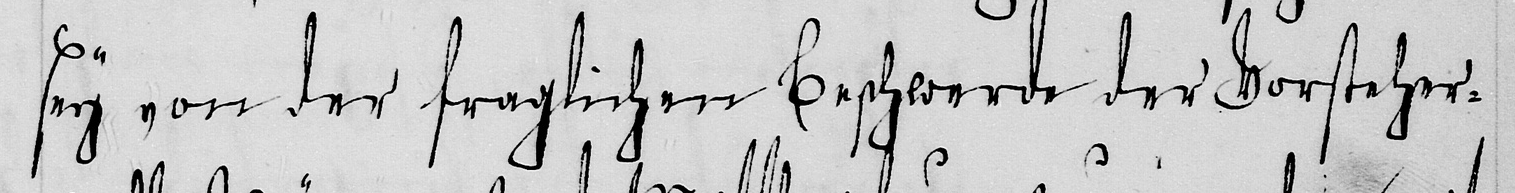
sey von der fraglichen Beschwerde der Vorsteher¬
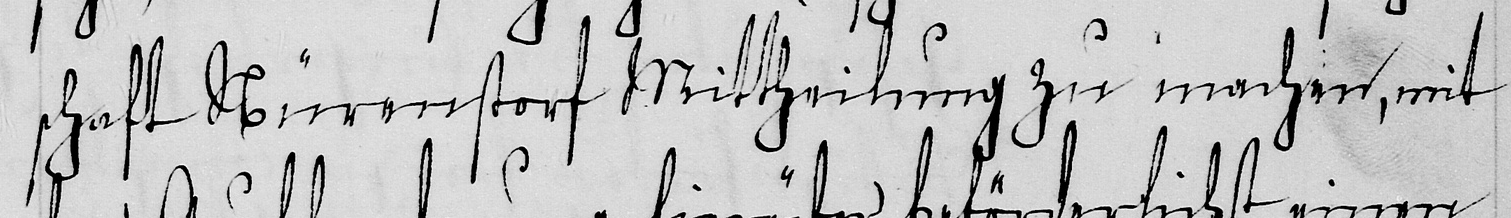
schaft Nürenstorf Mittheilung zu machen, mit
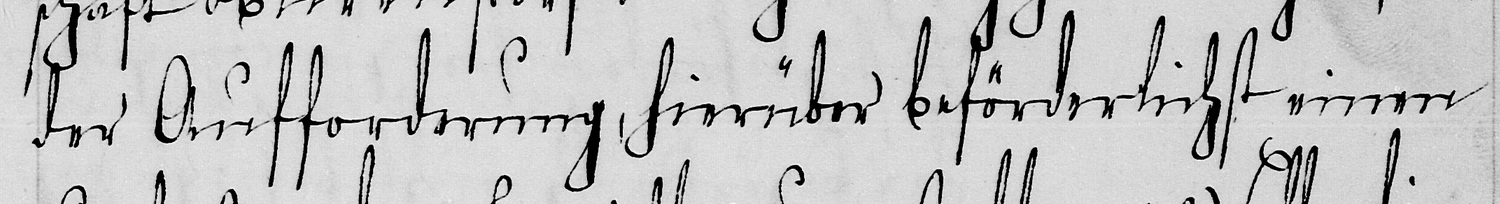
der Aufforderung, hierüber beförderlichst einen
